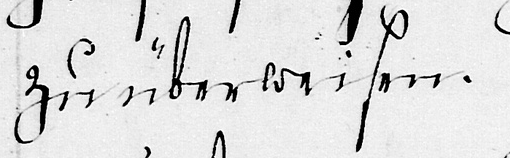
zu überweisen.
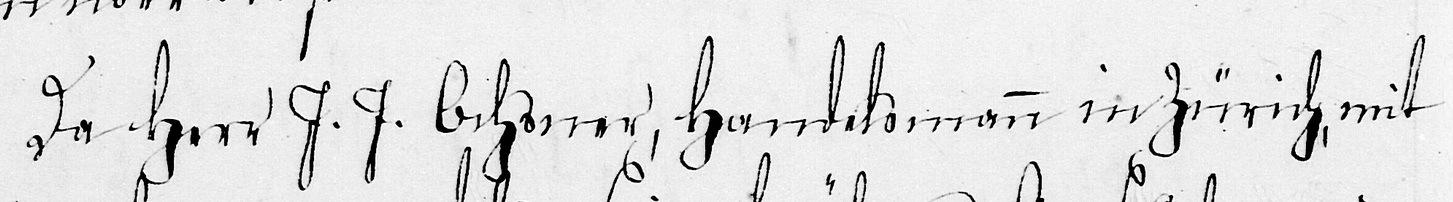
Da Herr J. J. Ochsner, Handelsmann in Zürich, mit
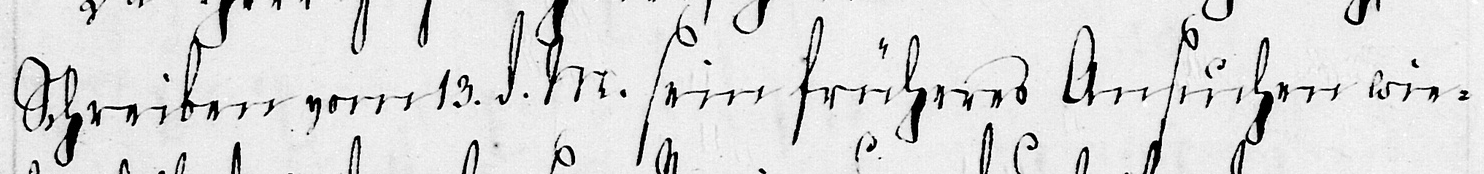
Schreiben vom 13. d. M. sein früheres Ansuchen wie¬
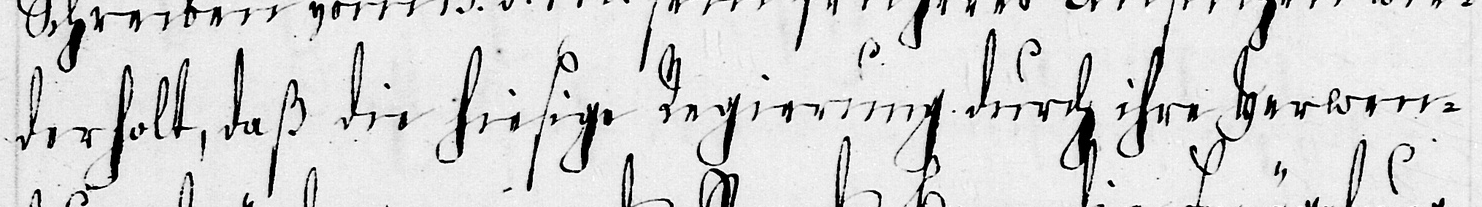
derholt, daß die hiesige Regierung durch ihre Verwen¬
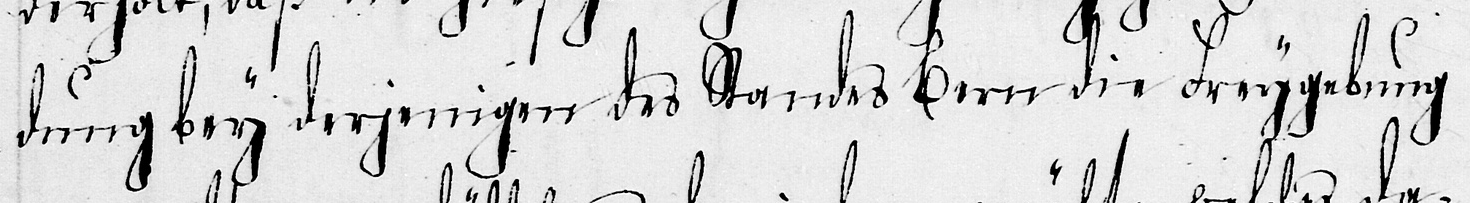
dung bey derjenigen des Standes Bern die Freygebung
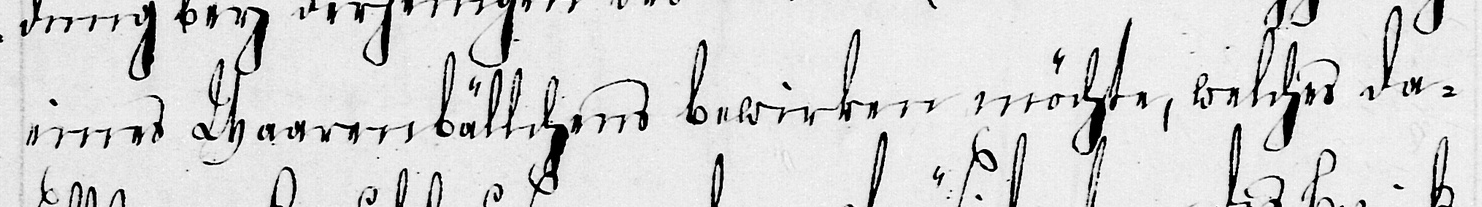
eines Waarenbällchens bewirken möchte, welches da¬
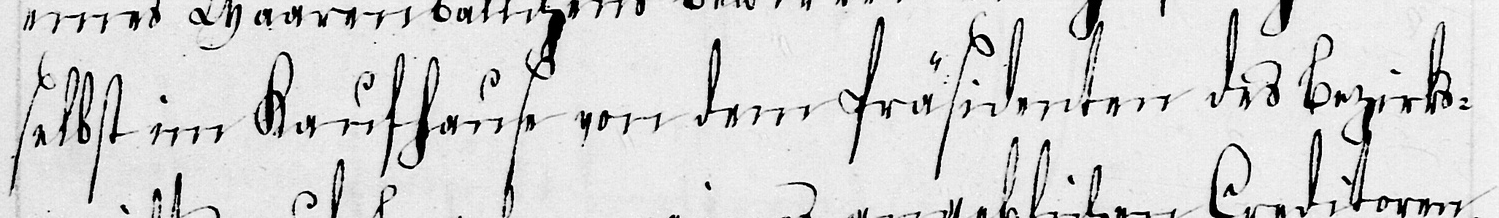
selbst im Kaufhause von dem Präsidenten des Bezirks¬
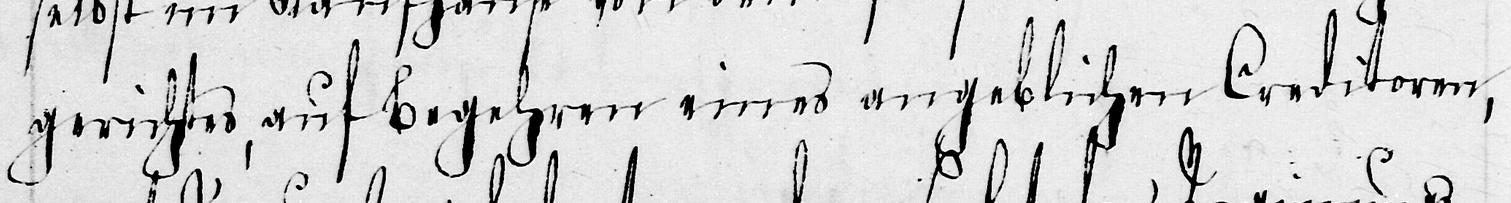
gerichtes, auf Begehren eines angeblichen Creditoren,
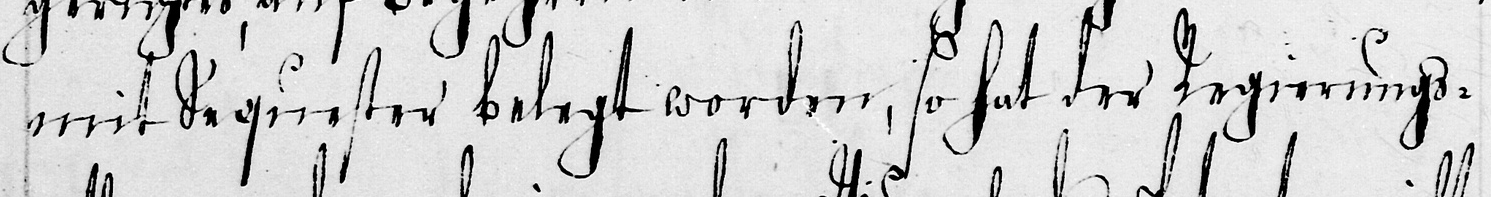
mit Sequester belegt worden, so hat der Regierungs¬
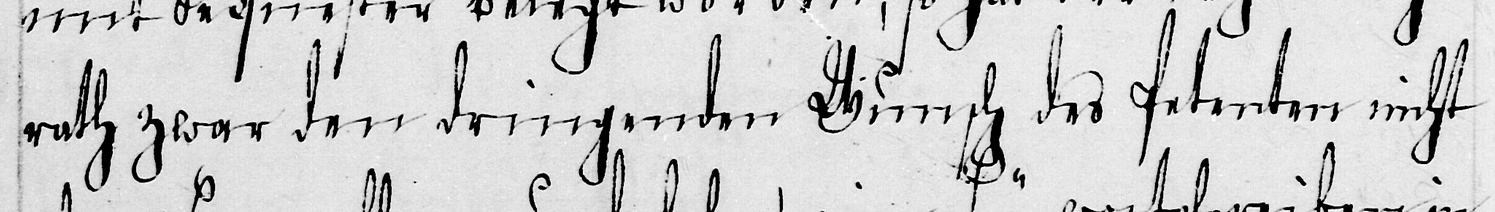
rath zwar den dringenden Wunsch des Petenten nicht
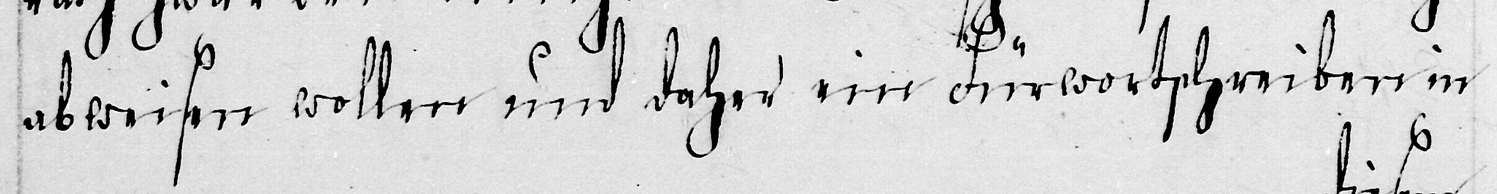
abweisen wollen und daher ein Fürwortschreiben in
